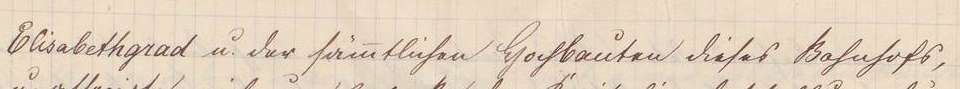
Elisabethgrad u. der sämmtlichen Hochbauten dieses Bahnhofs,
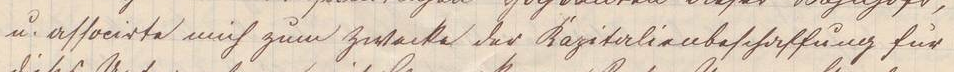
u. associrte mich zum Zwecke der Kapitalienbeschaffung für
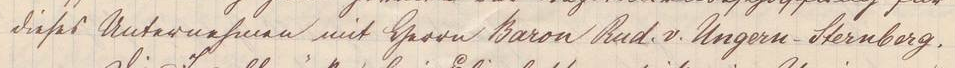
dieses Unternehmen mit Herrn Baron Rud. v. Ungern-Sternberg.
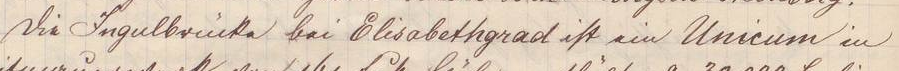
Die Ingulbrücke bei Elisabethgrad ist ein Unicum in
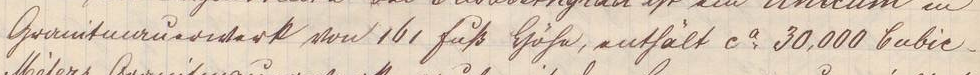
Granitmauerwerk von 161 Fuß Höhe, enthält ca 30,000 Cubic-
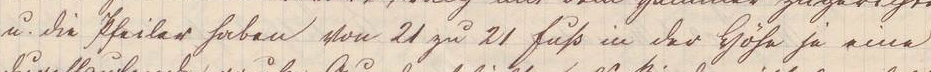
u. die Pfeiler haben von 21 zu 21 Fuß in der Höhe je eine
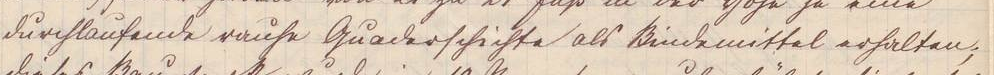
durchlaufende rauhe Quaderschichte als Bindemittel erhalten;
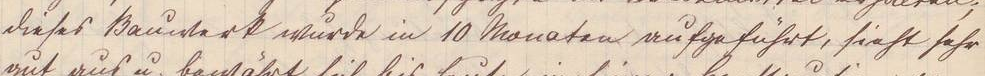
dieses Bauwerk wurde in 10 Monaten aufgeführt, sieht sehr
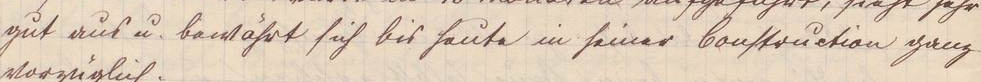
gut aus u. bewährt sich bis heute in seiner Construction ganz
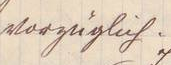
vorzüglich.
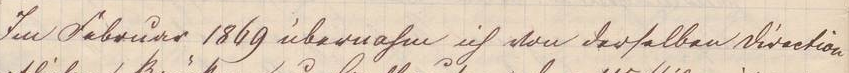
Im Februar 1869 übernahm ich von derselben Direktion
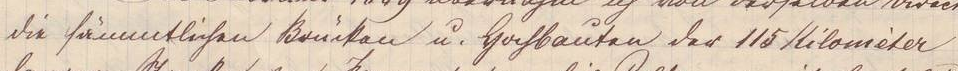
die sämmtlichen Brücken u. Hochbauten der 115 Kilomèter
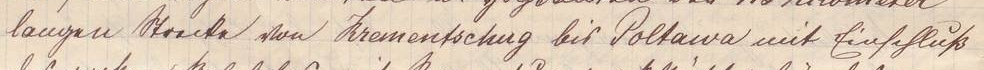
langen Strecke von Krementschug bis Poltawa mit Einschluß
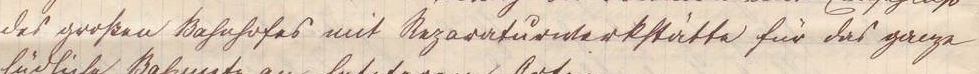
des großen Bahnhofes mit Reparaturwerkstätte für das ganze
